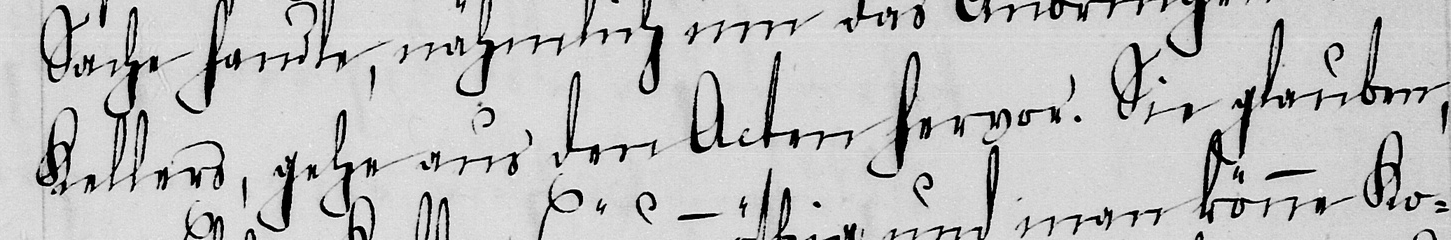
Kellers, gehe aus den Acten hervor. Sie glauben,
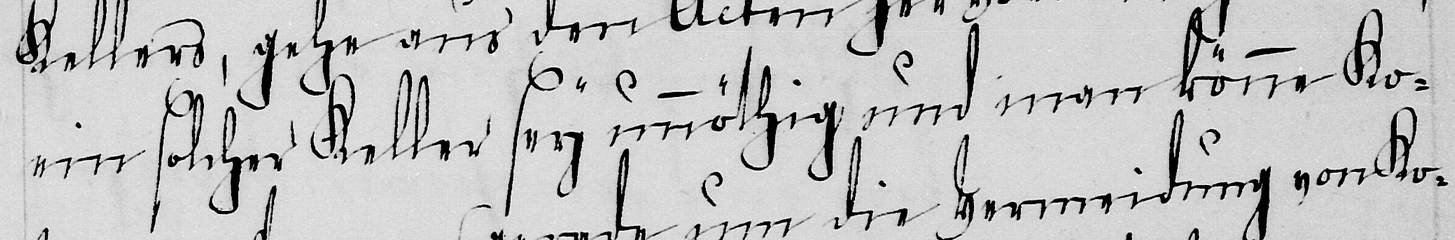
ein solcher Keller sey unnöthig und man könne Ko¬
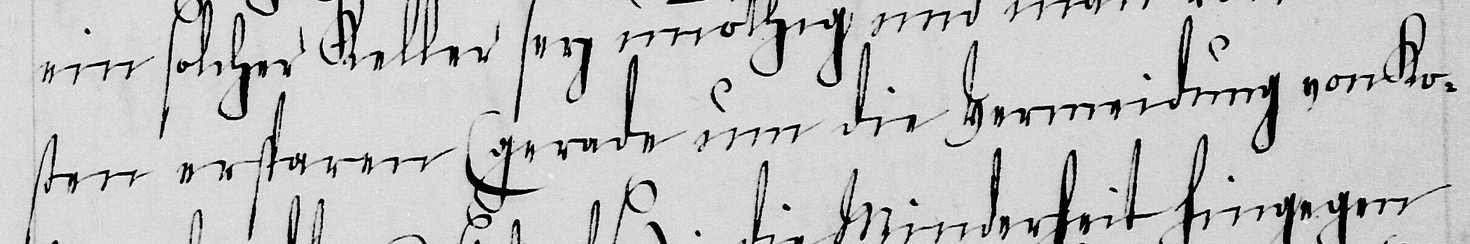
sten ersparen (gerade um die Vermeidung von Ko¬
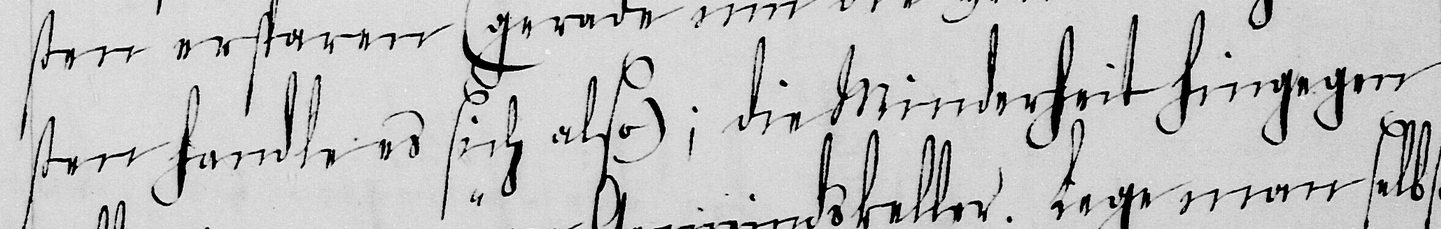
sten handle es sich also); die Minderheit hingegen
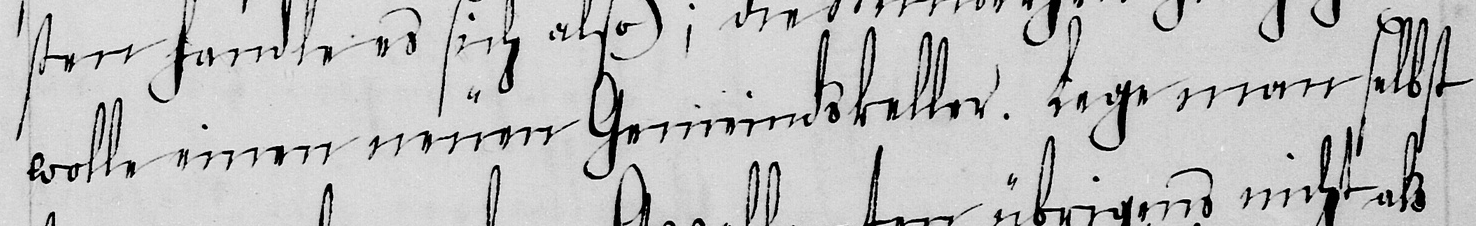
wolle einen neuen Gemeindskeller. Lege man selbst
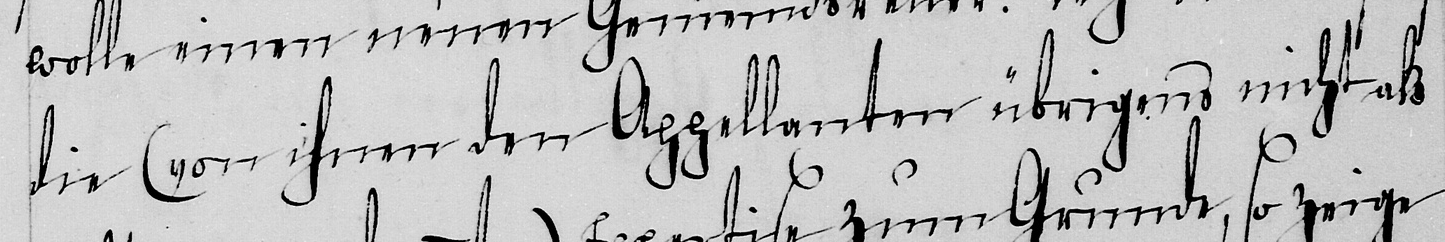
die (von ihnen den Appellanten übrigens nicht als
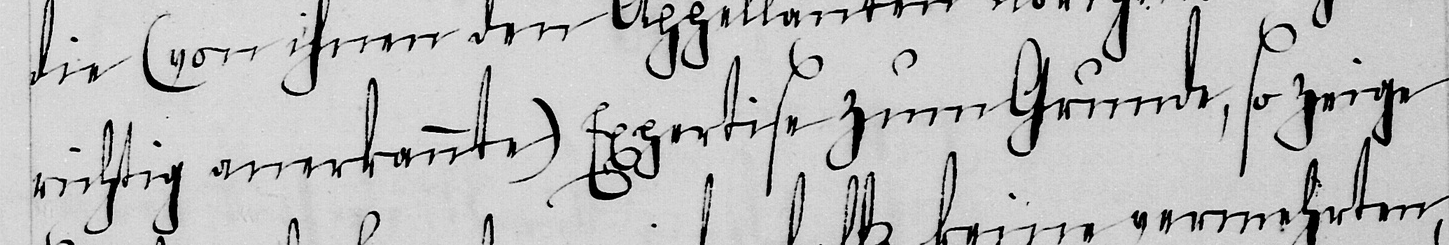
richtig anerkannte) Expertise zum Grunde, so zeige
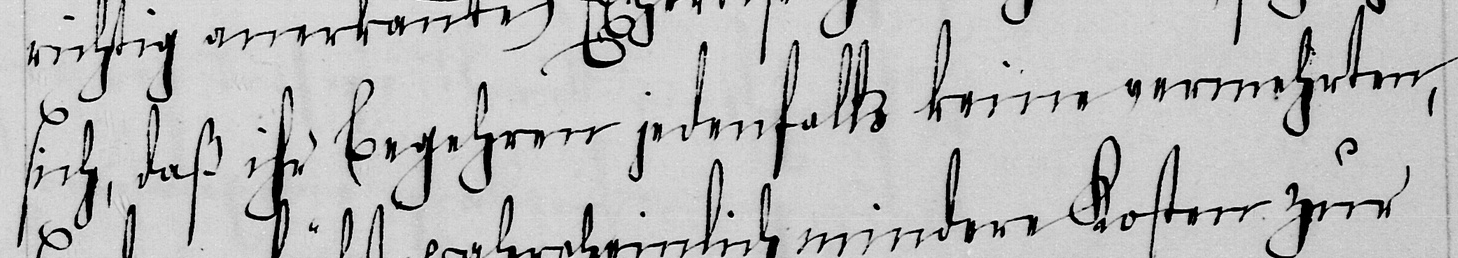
sich, daß ihr Begehren jedenfalls keine vermehrten,
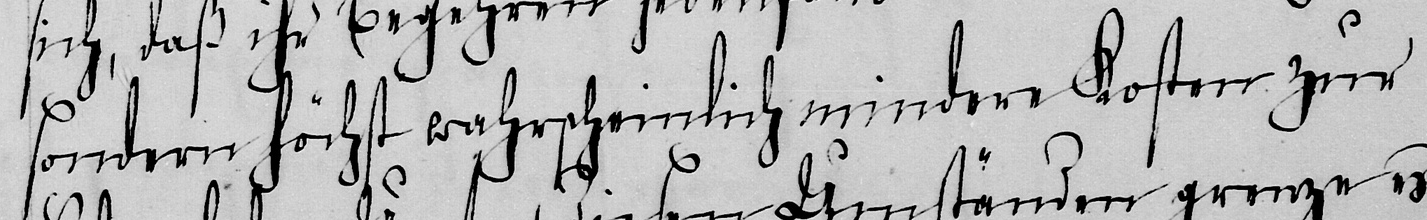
sondern höchst wahrscheinlich mindere Kosten zur
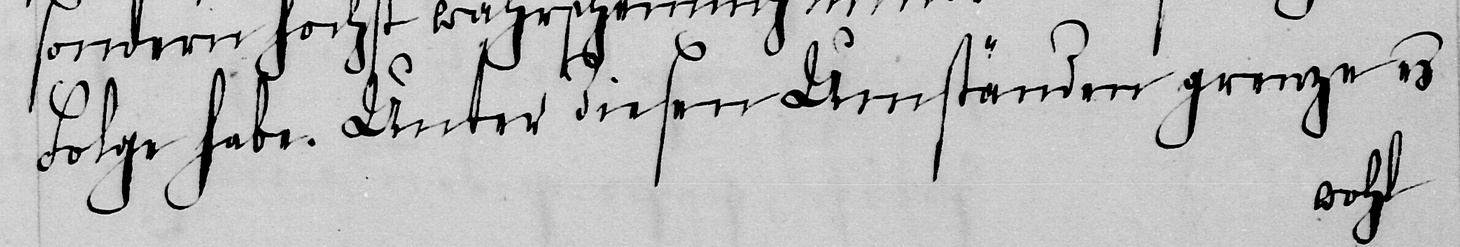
Folge habe. Unter diesen Umständen grenze es
